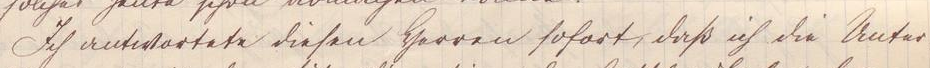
Ich antwortete diesen Herren sofort, daß ich die Unter-
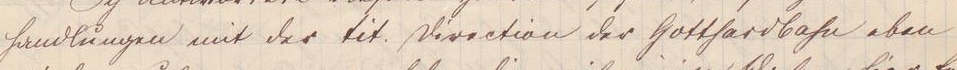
handlungen mit der tit. Direction der Gotthardbahn eben
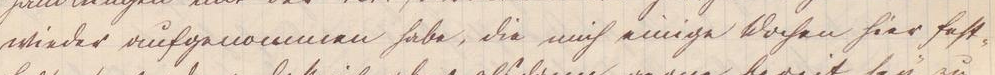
wieder aufgenommen habe, die mich einige Woche hier fest-
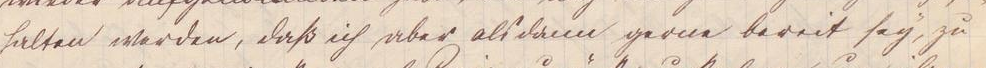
halten werden, daß ich aber als dann gerne bereit sey, zu
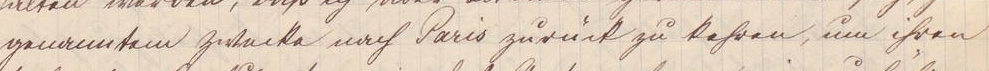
genanntem Zwecke nach Paris zurück zu kehren, um ihren
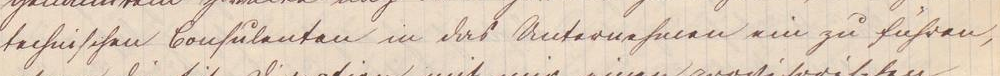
technischen Consulenten in das Unternehmen ein zu führen,
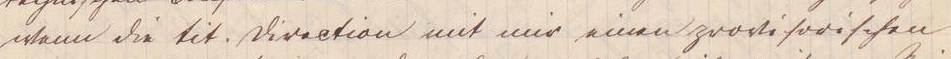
wenn die tit. Direction mit mir einen provisorischen
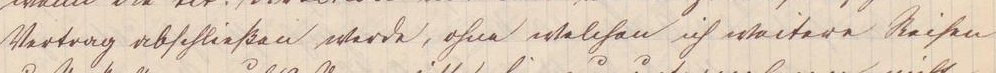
Vertrag abschließen werde, ohne welchen ich weitere Reisen
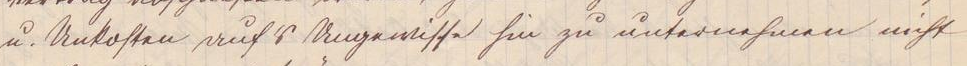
u. Unkosten auf's Ungewisse hin zu unternehmen nicht
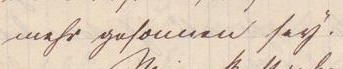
mehr gesonnen sey.
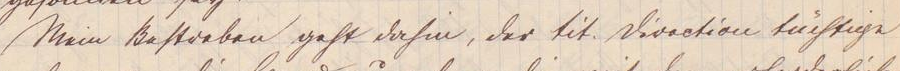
Mein Bestreben geht dahin, der tit. Direction tüchtige
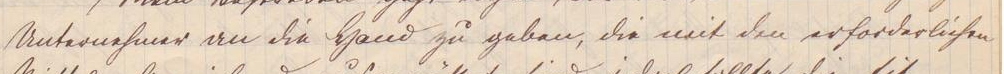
Unternehmer an die Hand zu geben, die mit den erforderlichen
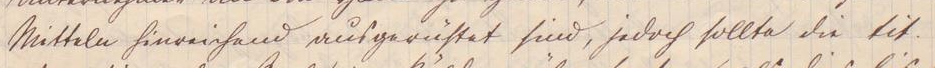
Mitteln hinreichend ausgerüstet sind, jedoch sollte die tit.
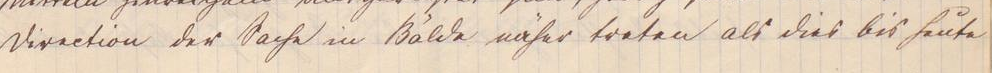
Direction der Sache in Bälde näher treten als dies bis heute
